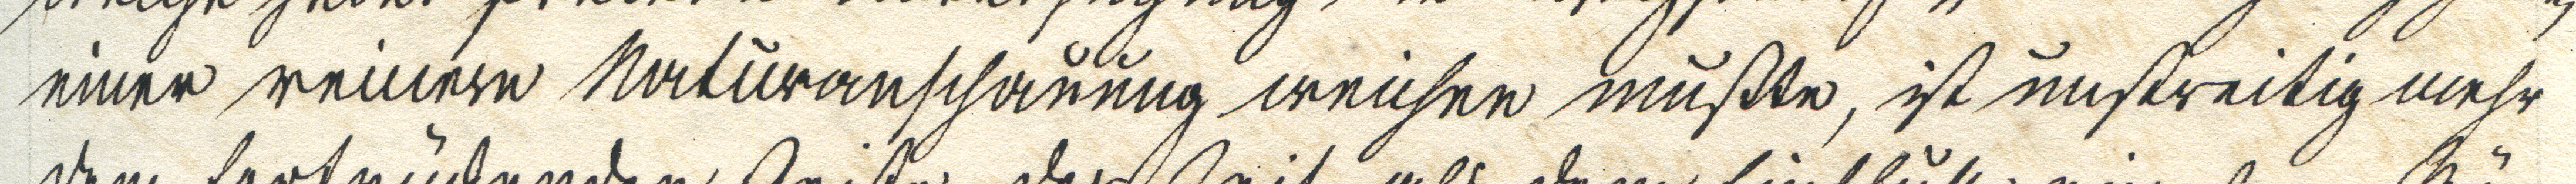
einer reinern Naturanschauung weichen mußte, ist unstreitig mehr
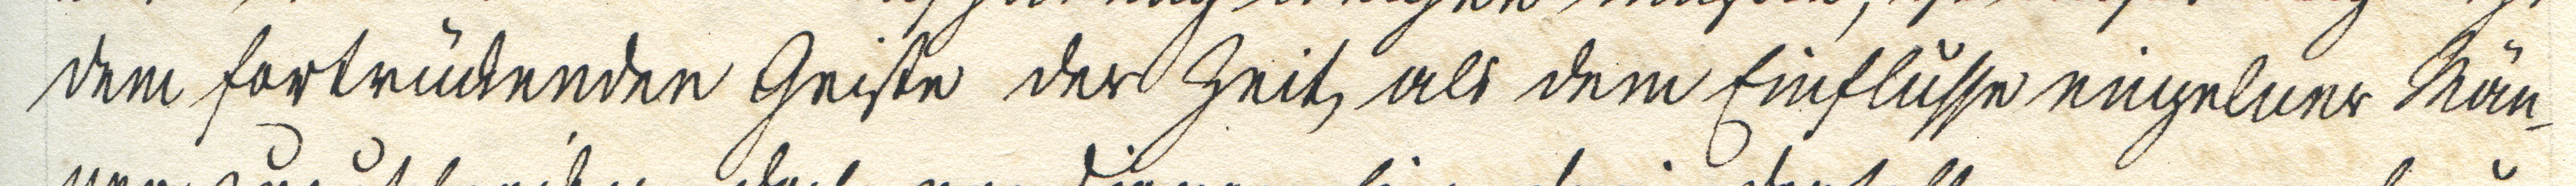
dem fortrückenden Geiste der Zeit, als dem Einflusse einzelner Män-
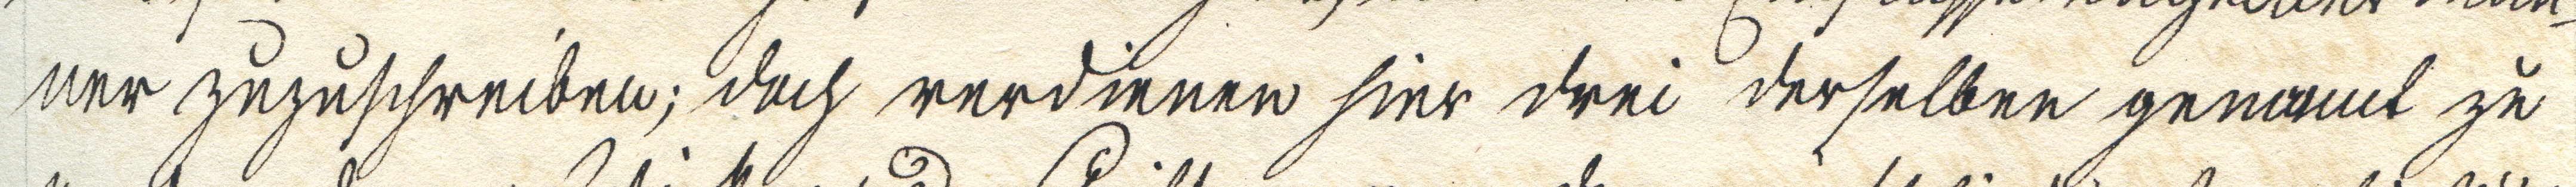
ner zuzuschreiben; doch verdienen hier drei derselben genannt zu
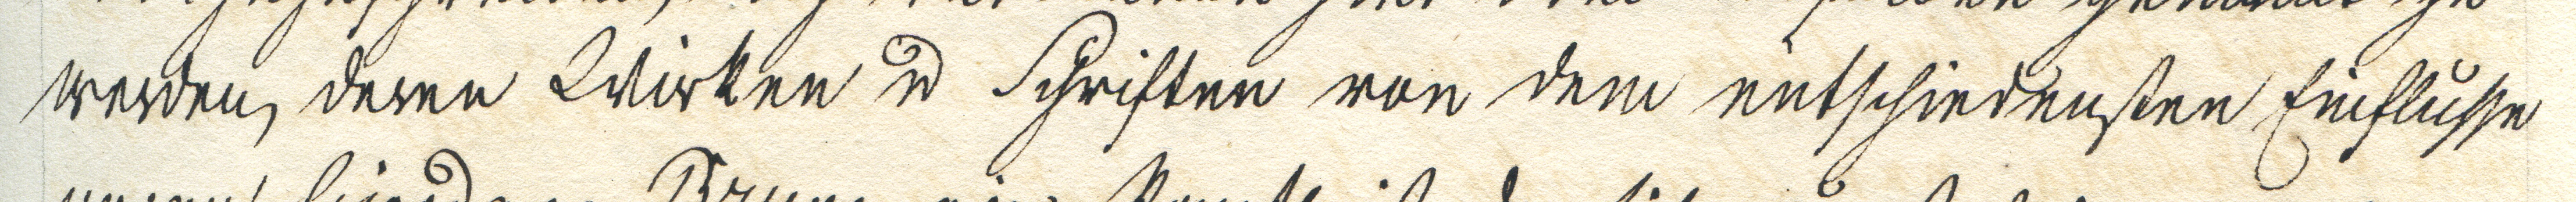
werden, deren Wirken u Schriften von dem entschiedensten Einflusse
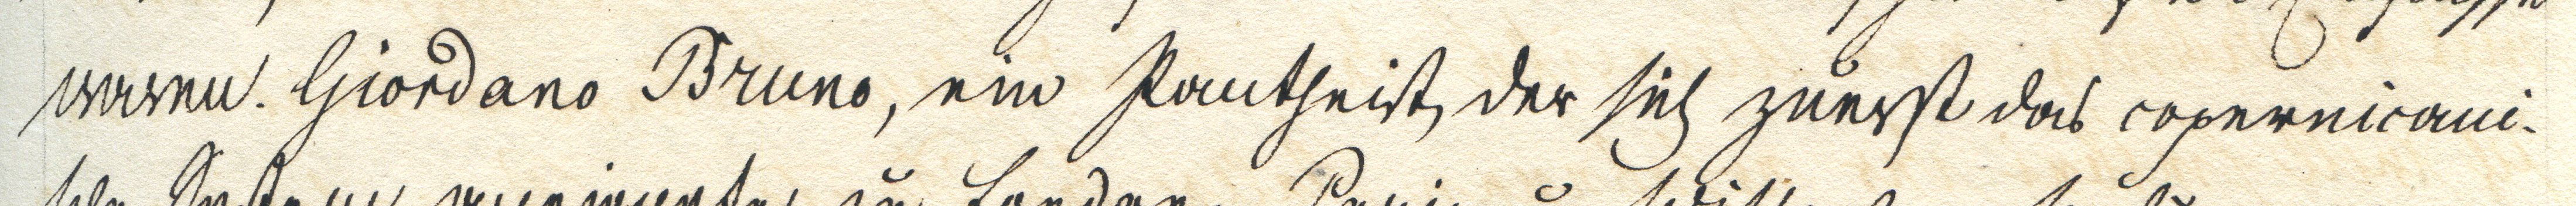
waren. Giordano Bruno, ein Pantheist, der sich zuerst das copernicani-
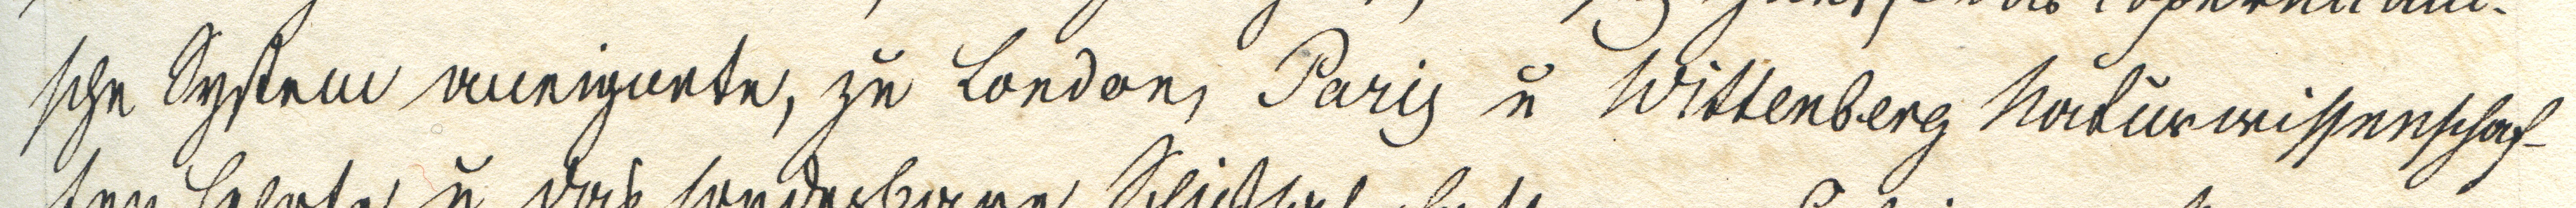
sche System aneignete, zu London, Paris u Wittenberg Naturwissenschaf-
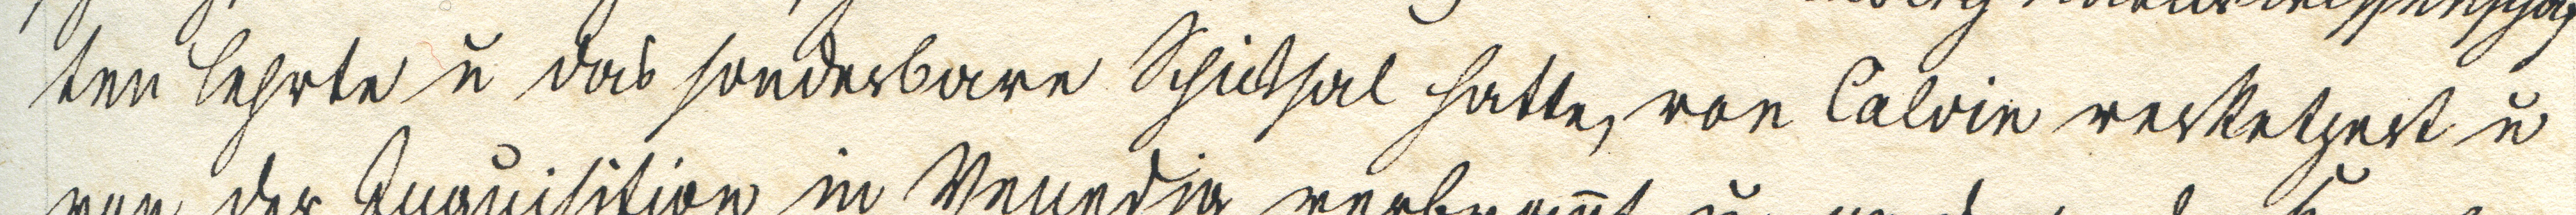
ten lehrte u das sonderbare Schicksal hatte, von Calvin verketzert u
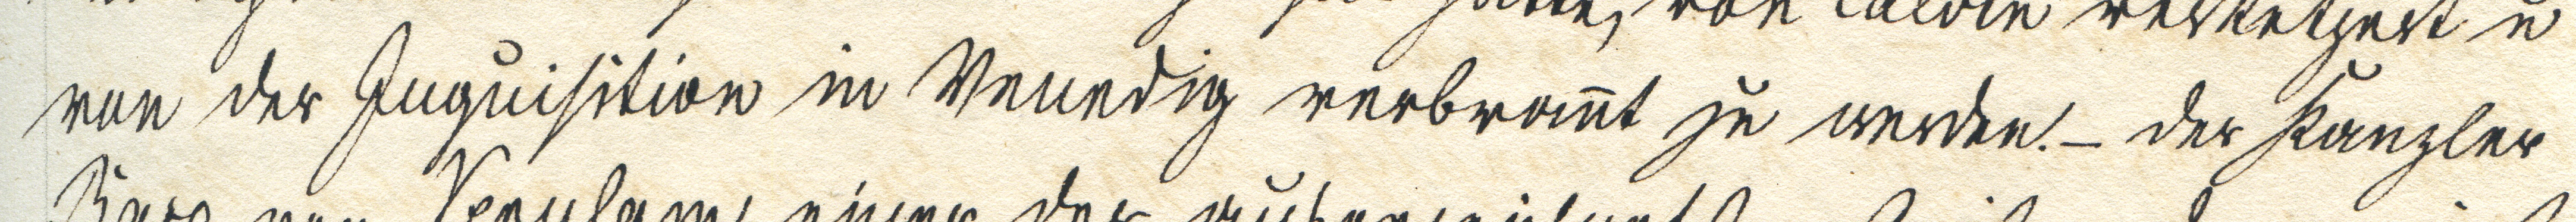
von der Inquisition in Venedig verbrañt zu werden. – der Kanzler
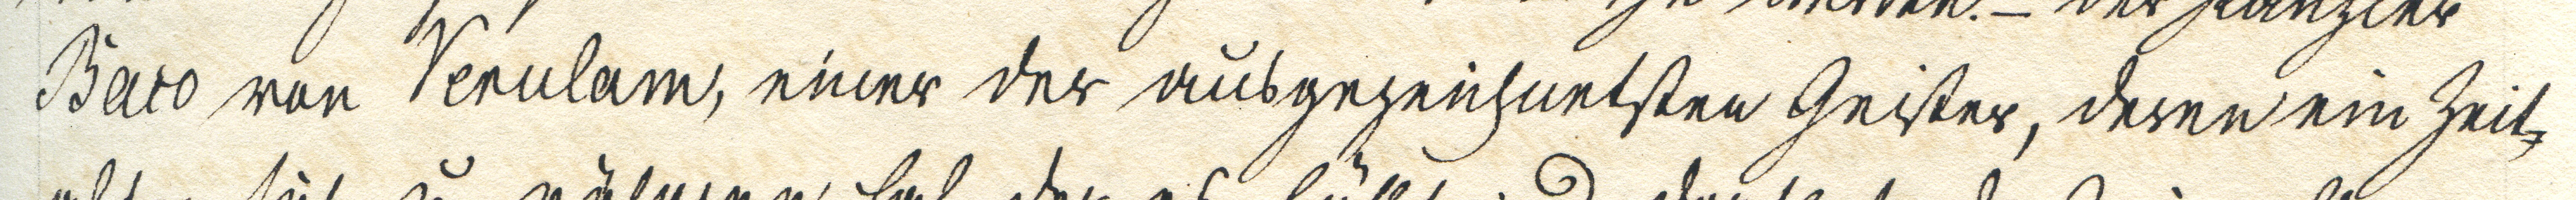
Baco von Verulam, einer der ausgezeichnetsten Geister, deren ein Zeit-
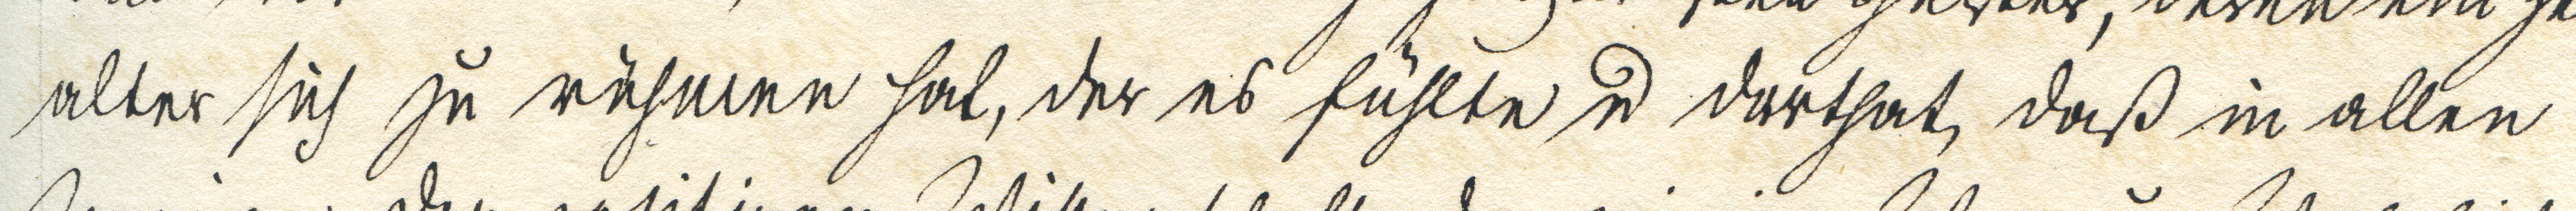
alter sich zu rühmen hat, der es fühlte u darthat, daß in allen
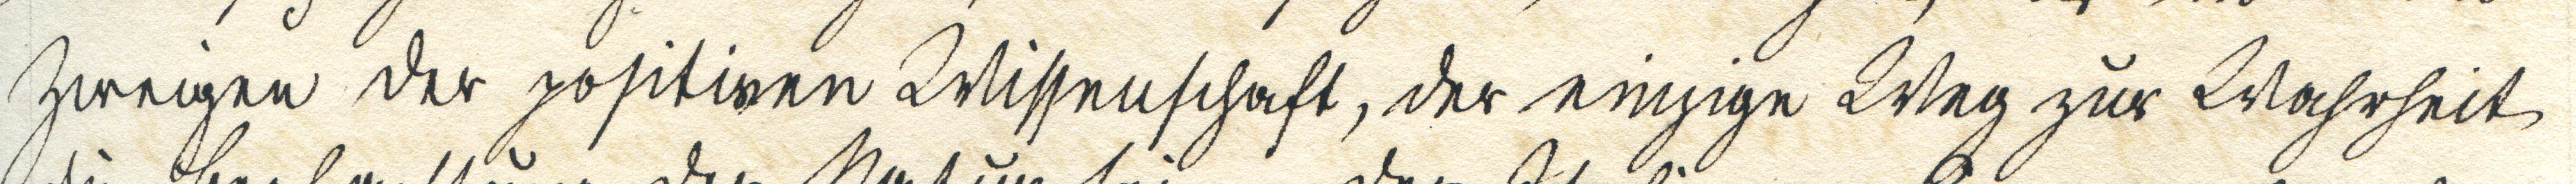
Zweigen der positiven Wissenschaft, der einzige Weg zur Wahrheit
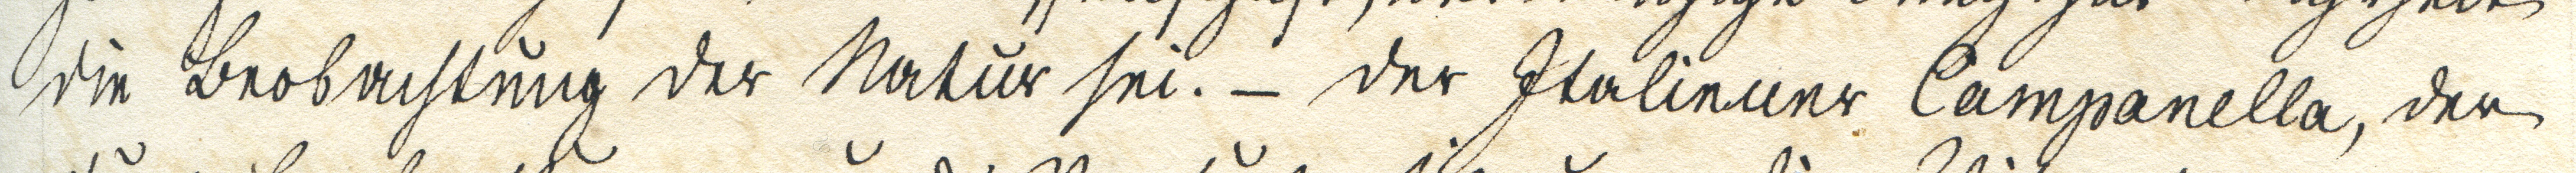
die Beobachtung der Natur sei. – der Italiener Campanella, der
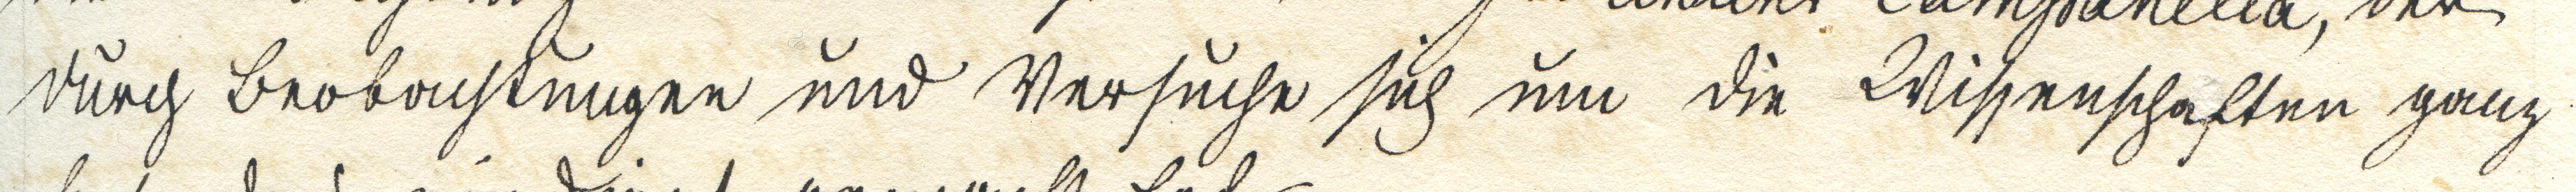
durch Beobachtungen und Versuche sich um die Wissenschaft ganz
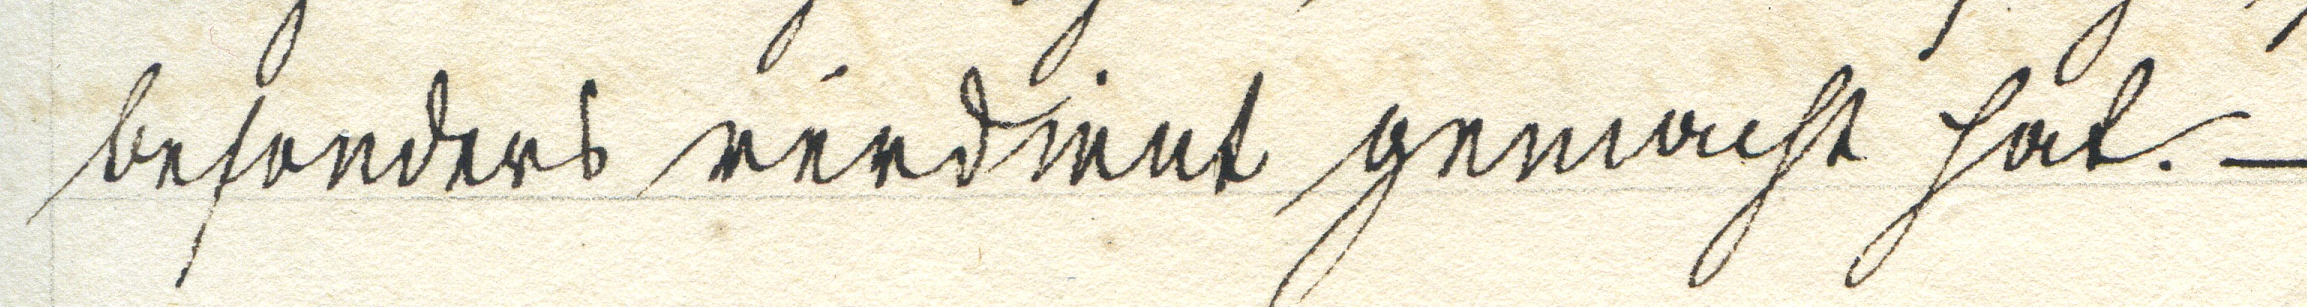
besonders verdient gemacht hat. –
